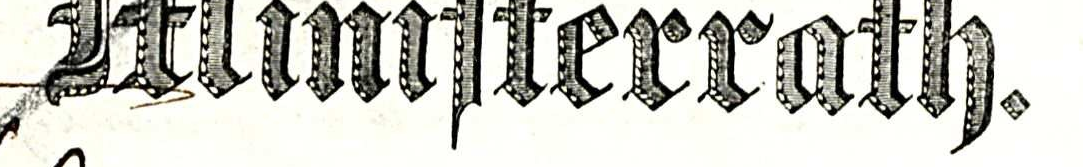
Ministerrath.
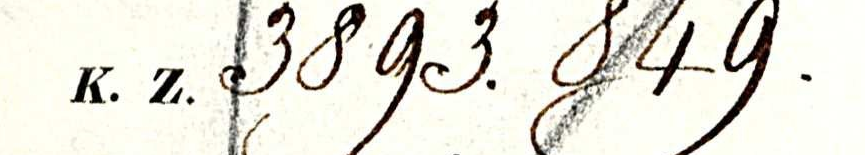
K. Z. 3893. 849.
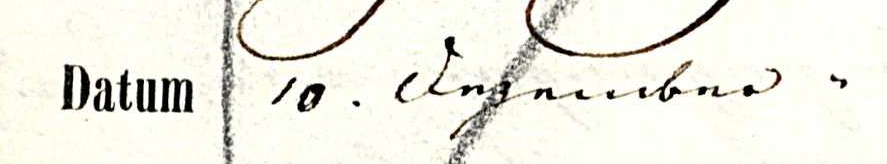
Datum 10. Dezember 849
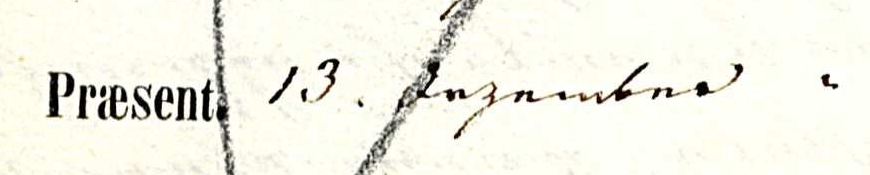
Præsent. 13. Dezember 849
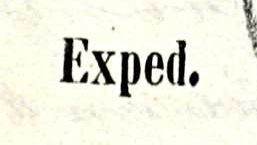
Exped.
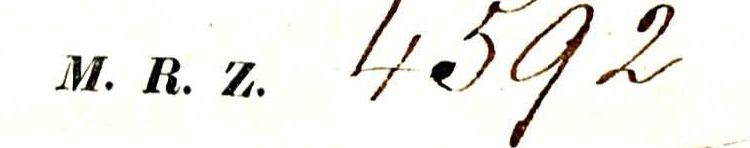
M. R. Z. 4592
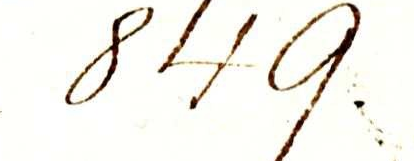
849
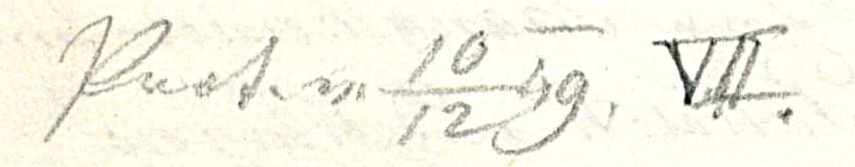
Prot. v. 10/12 49 VII.
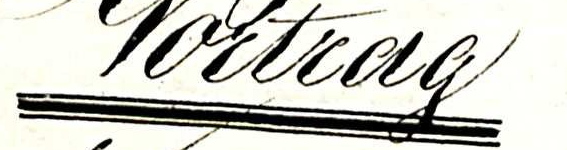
VORTRAG
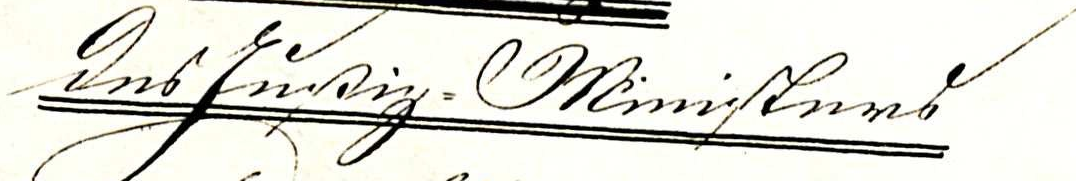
des Justiz=Ministers
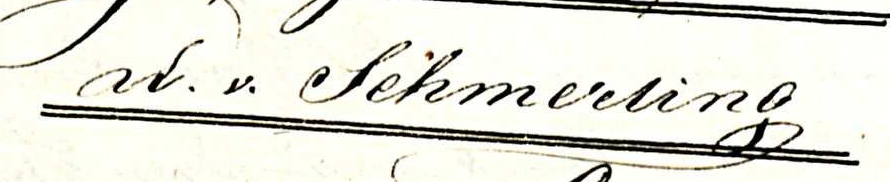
R. v. Schmerling
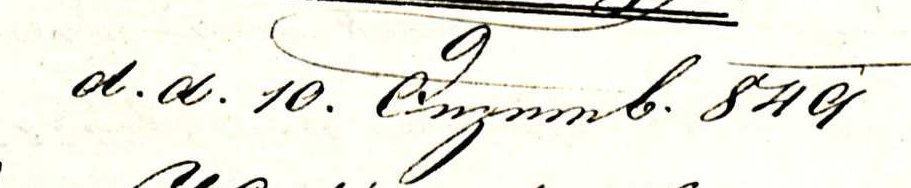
d. d. 10. Dezemb. 849
